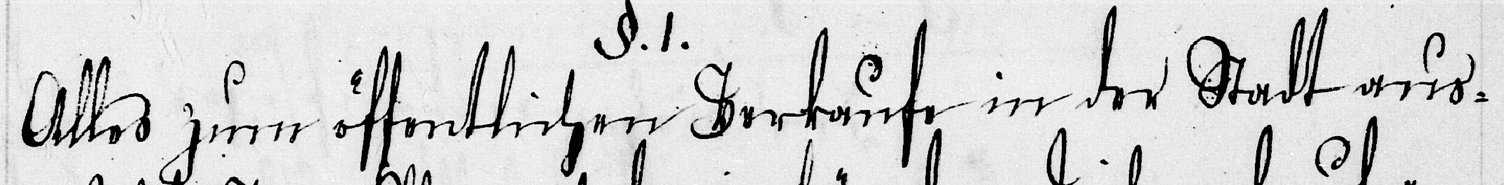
Alles zum öffentlichen Verkaufe in der Stadt aus¬
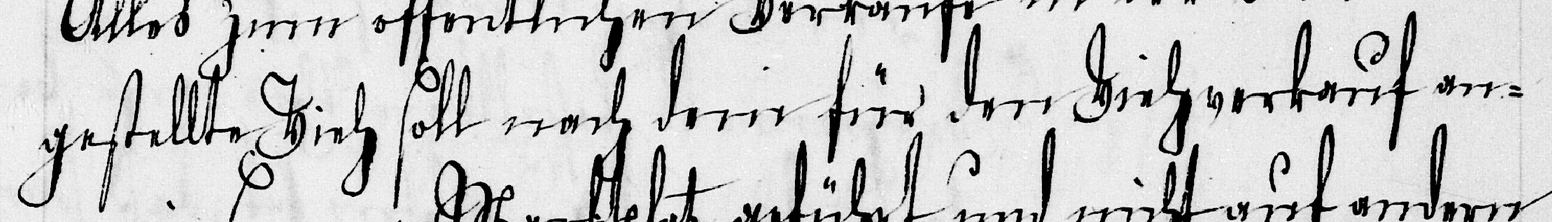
gestellte Vieh soll nach dem für den Viehverkauf an¬
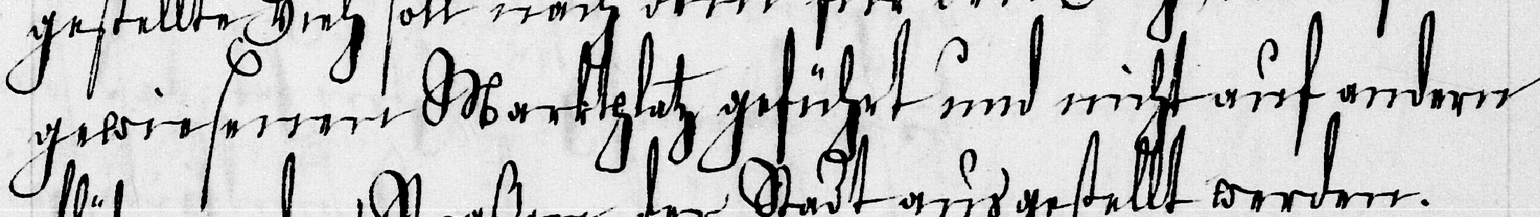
gewiesenen Marktplatz geführt und nicht auf andern
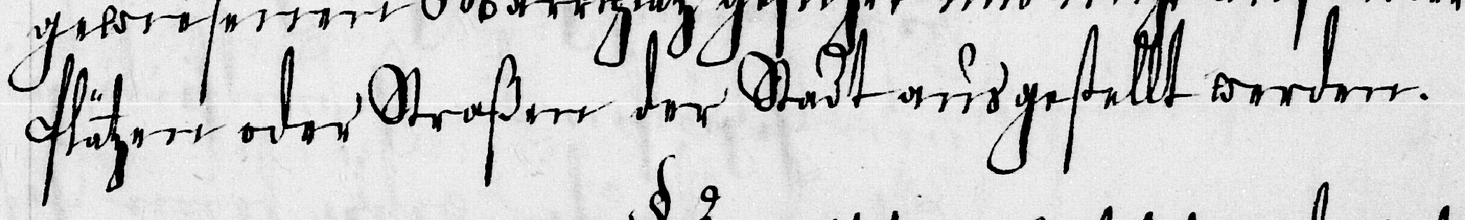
Plätzen oder Straßen der Stadt ausgestellt werden.
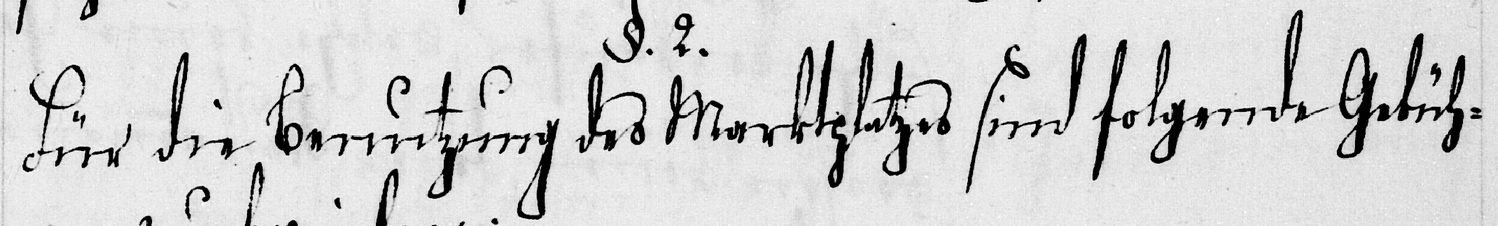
Für die Benutzung des Marktplatzes sind folgende Gebüh¬
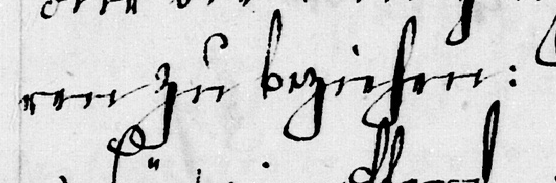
ren zu beziehen:
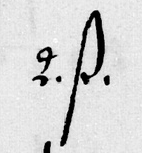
2. ß.
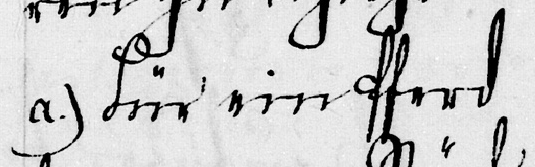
a.) Für ein Pferd
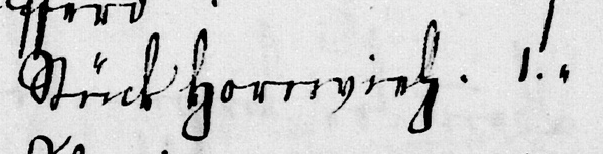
Stück Hornvieh . .
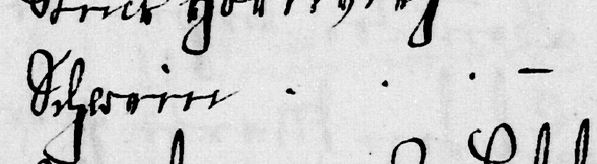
Schwein .
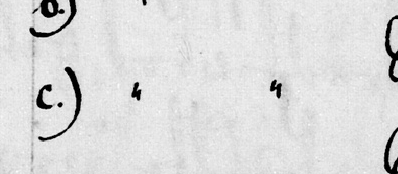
c.) “ “
